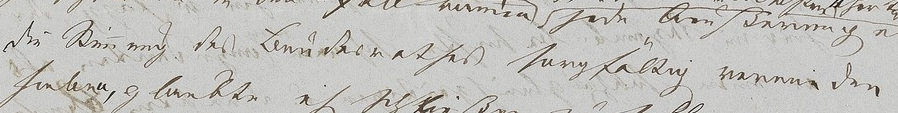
die Stimmung des Bundesrathes sorgfältig vermieden
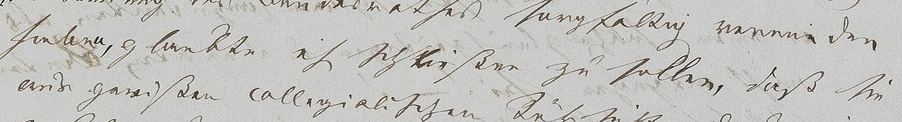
haben, glaubte ich schließen zu sollen, daß sie
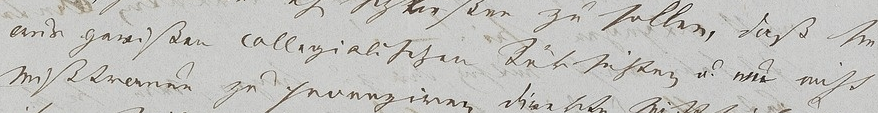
aus gewißen collegialischen Rüksichten u. um nicht
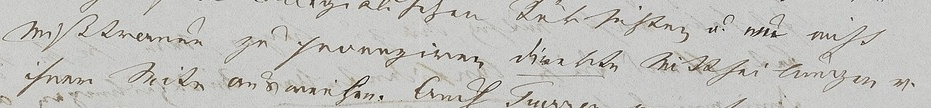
Mißtrauen zu provoziren direkte Mittheilungen v.
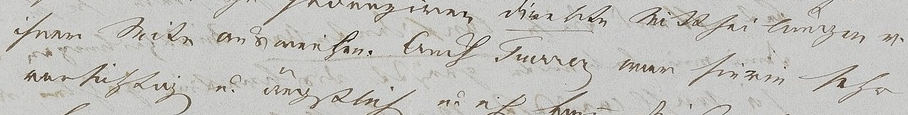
ihrer Seite ausweichen. Auch Furrer war hierin sehr
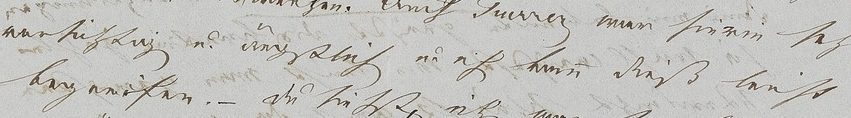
vorsichtig u. ängstlich u. ich kann dieß leicht
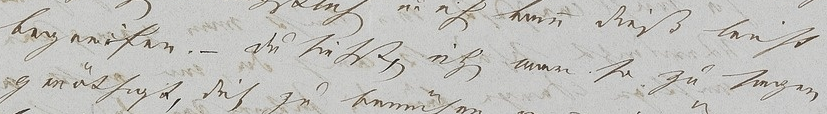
begreifen. – Du siehst, ich war so zu sagen
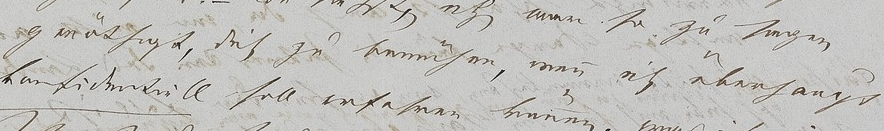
genöthigt, dich zu bemühen, wenn ich überhaupt
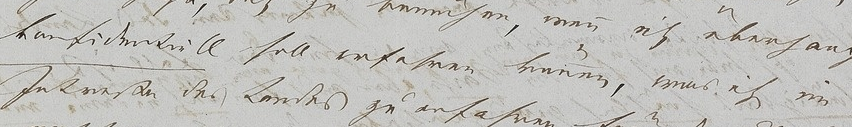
konfidentiell soll erfahren können, was ich im
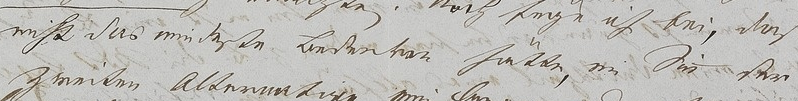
nicht das mindeste Bedenken hätte, im Sinn der
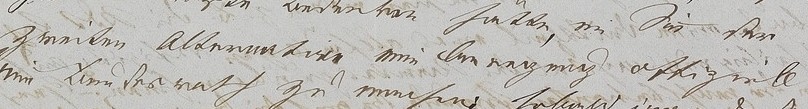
zweiten Alternative eine Anregung offiziell
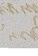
die
